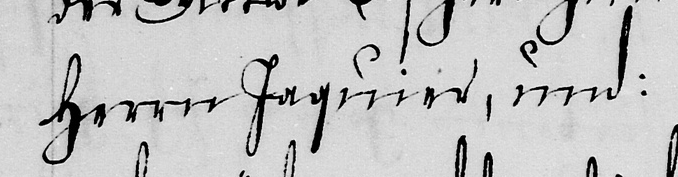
Herrn Jaquier, und:
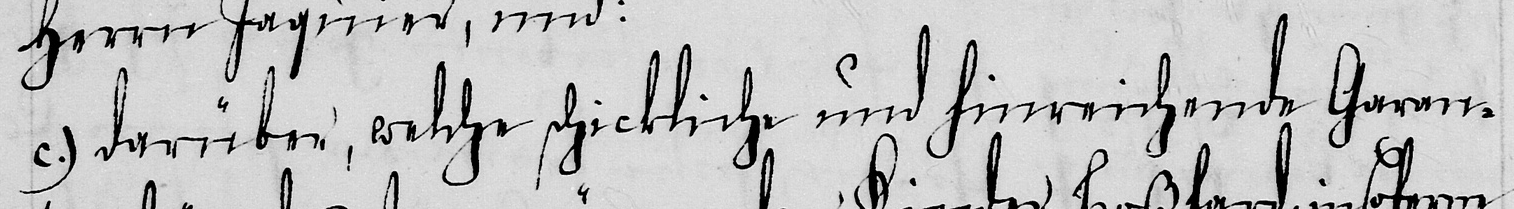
c.) darüber, welche schickliche und hinreichende Garan¬
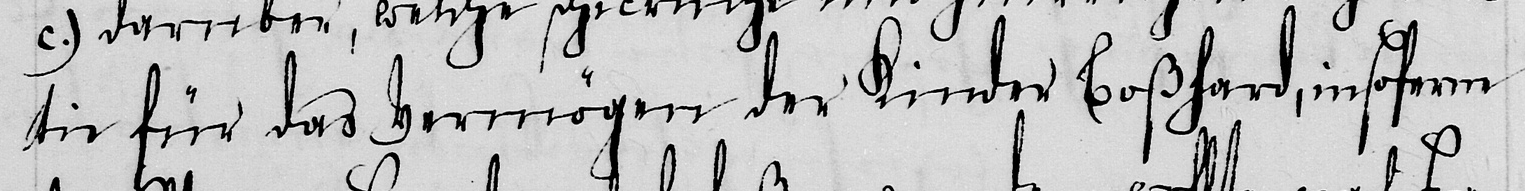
tie für das Vermögen der Kinder Boßhard, insoferne
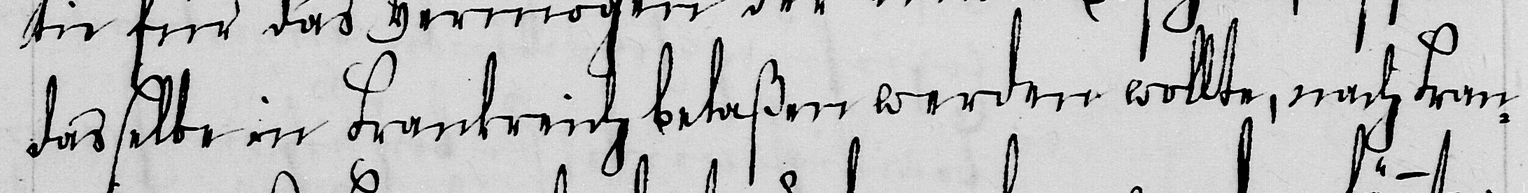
dasselbe in Frankreich belaßen werden wollte, nach Fran¬
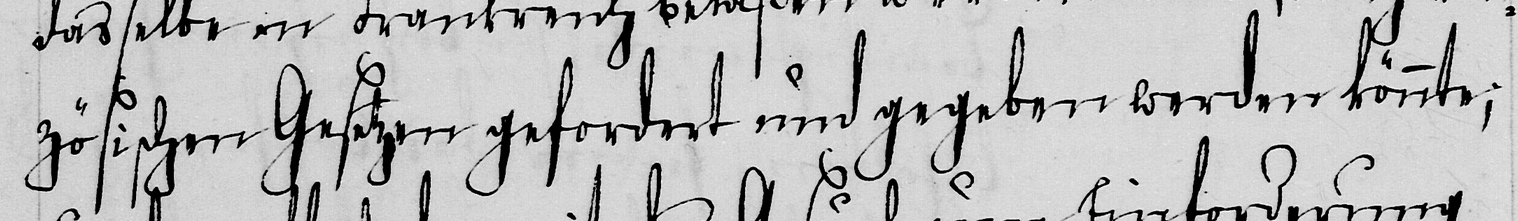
zösischen Gesetzen gefordert und gegeben werden könnte;
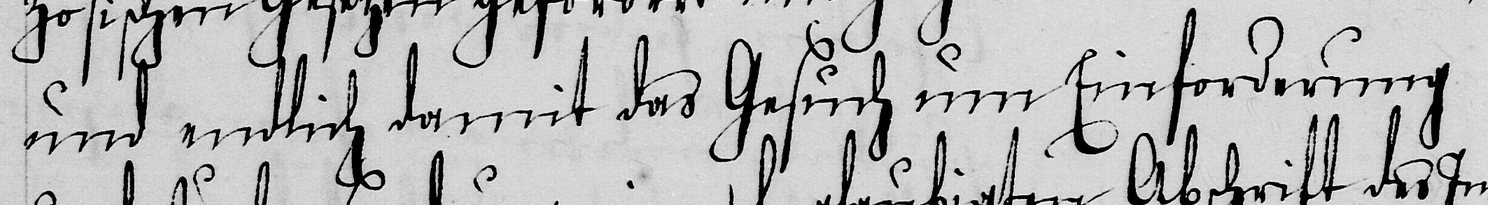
und endlich damit das Gesuch um Einforderung
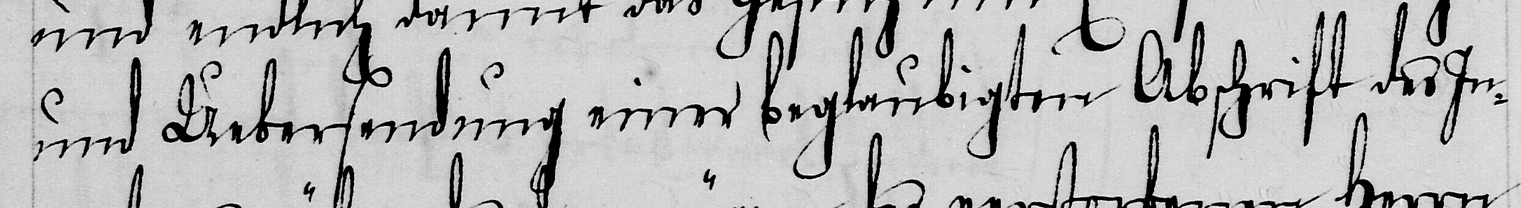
und Uebersendung einer beglaubigten Abschrift des In¬
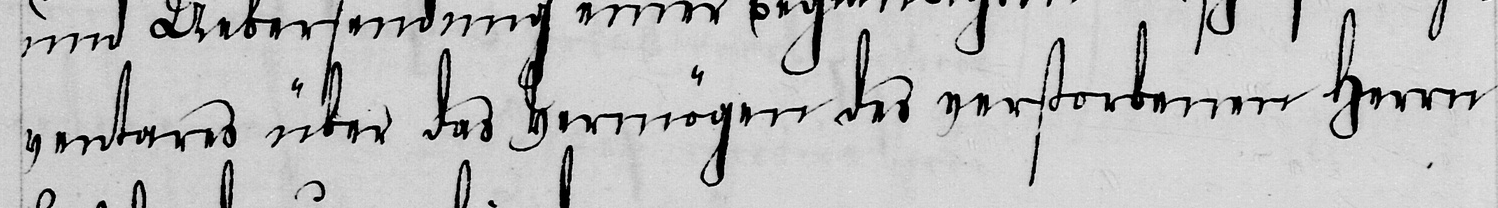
ventares über das Vermögen des verstorbenen Herrn
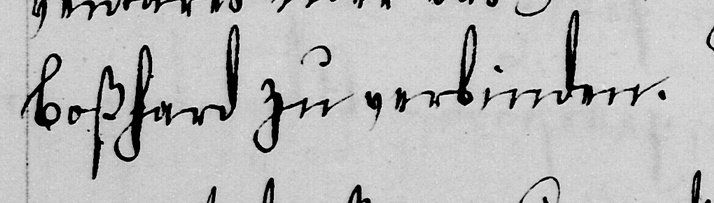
Boßhard zu verbinden.
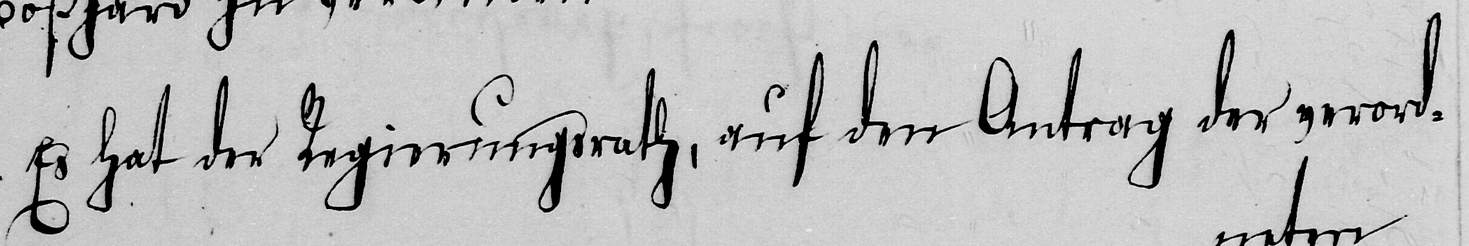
Es hat der Regierungsrath, auf den Antrag der verord-
